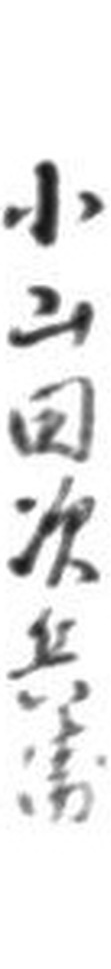小山田次兵衛
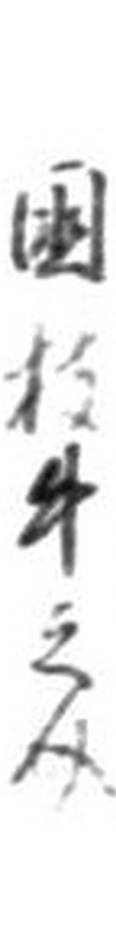国枝牛之介
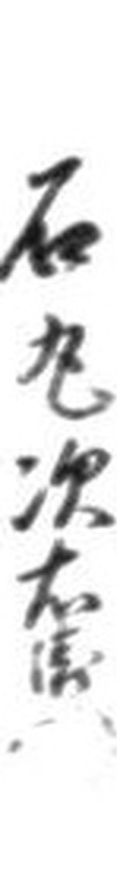石丸次右衛門
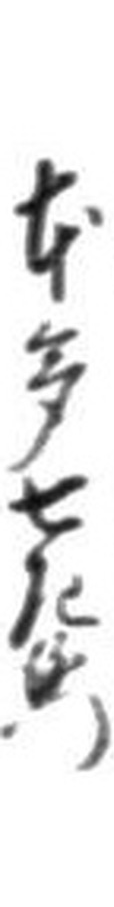本多七左衛門
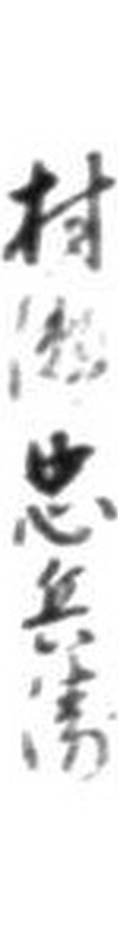村瀬忠兵衛
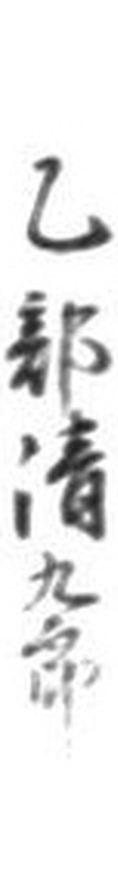乙部清九郎
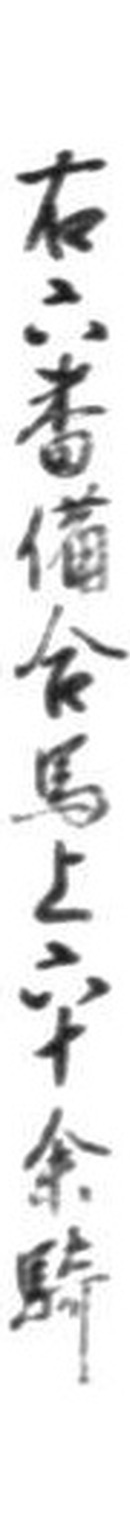右六番備合馬上六十余騎
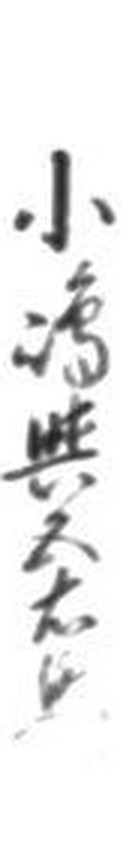小嶋与五右衛門
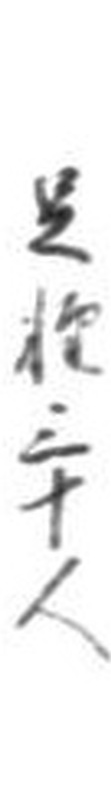足軽三十人
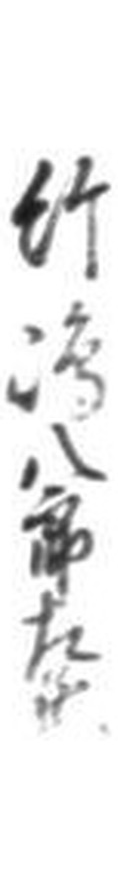竹嶋八郎左衛門
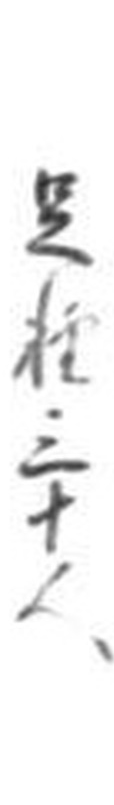足軽三十人
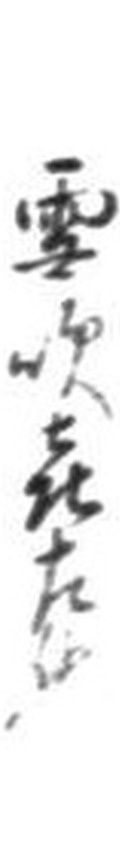雪吹喜左衛門

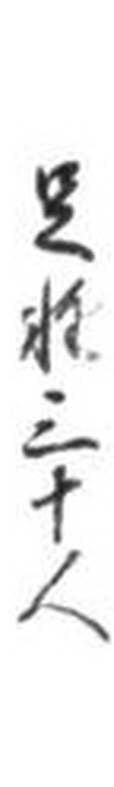足軽三十人
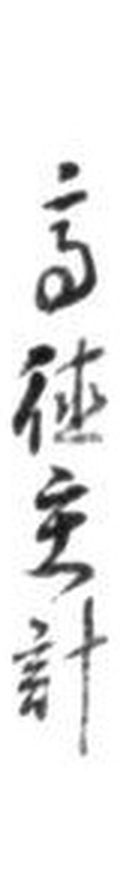高徳主計
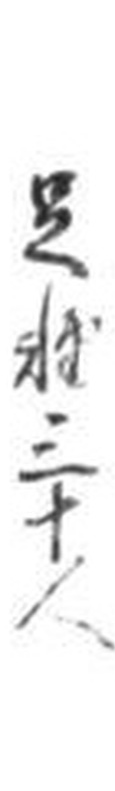足軽三十人
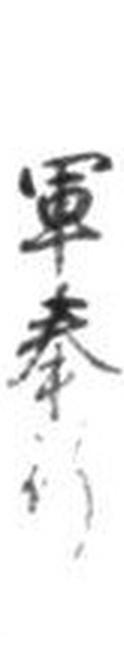軍奉行
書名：家譜 二 忠直公 従文禄四年到慶安四年
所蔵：福井県文書館 Fukui Prefectural Archives
